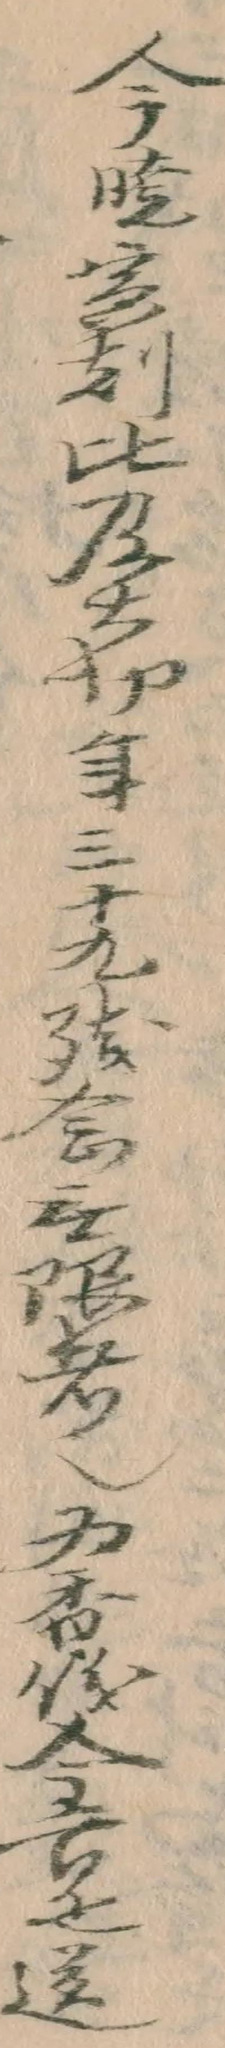今暁寅刻比及大切年三十九残念無限者也為香儀金百疋送
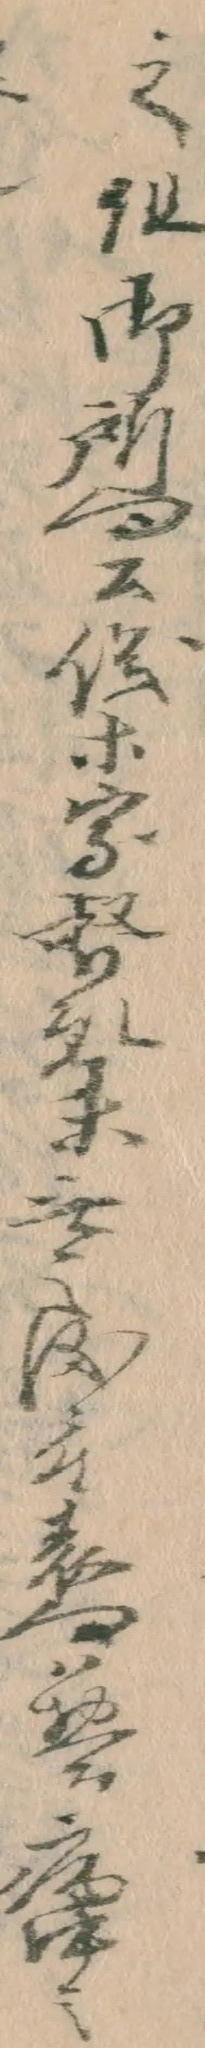也但御所向公儀等家督願末無之儀ニ付表向ハ惣而病中之
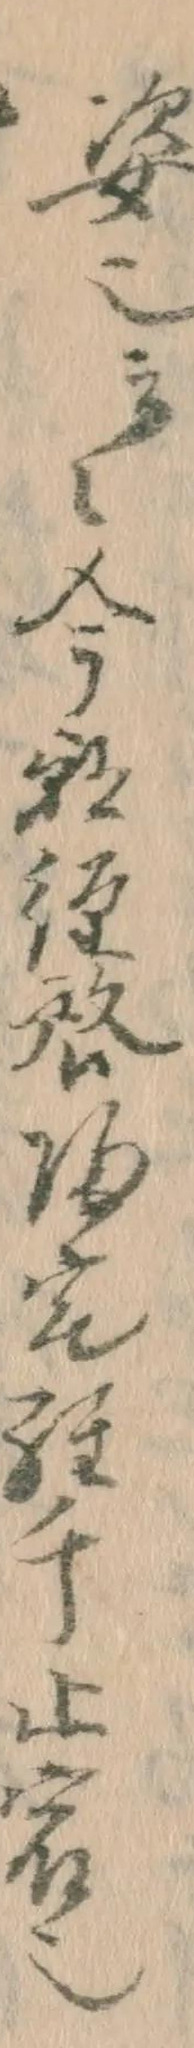姿也云々今朝経啓帰宅経千止宿也
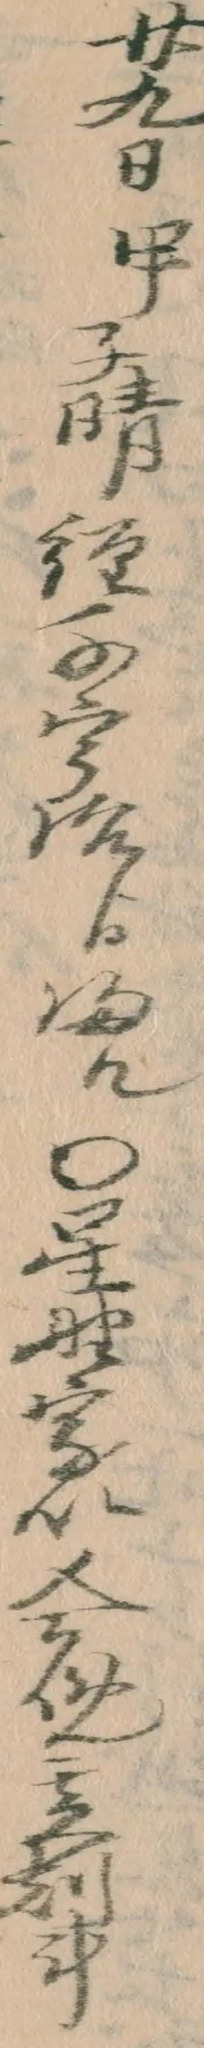廿九日甲子晴経千宇治ゟ帰ル〇星野宗以今晩亥刻斗
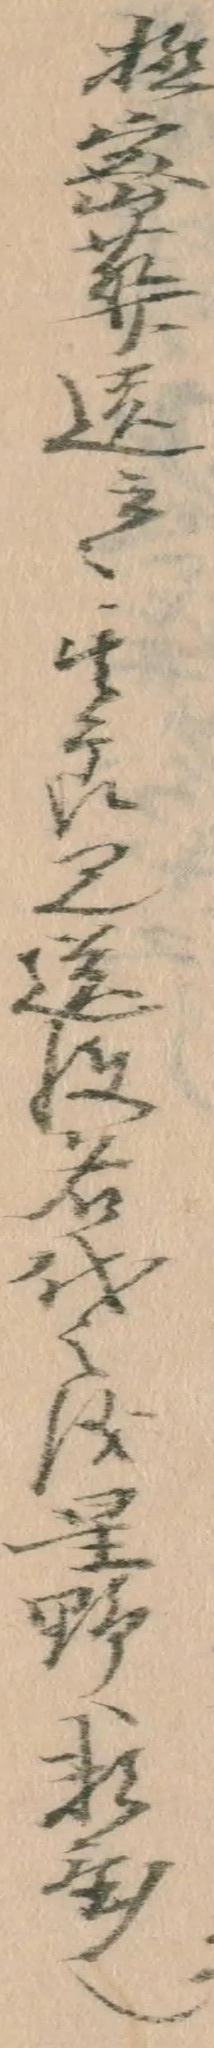極密葬送云々其節見送役名代之儀星野へ頼置也
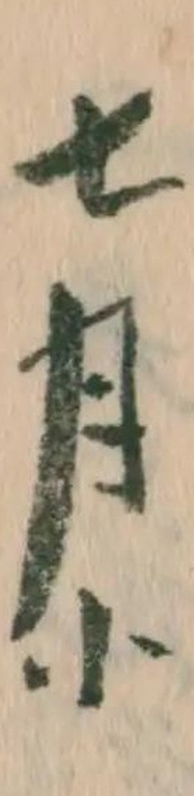七月小
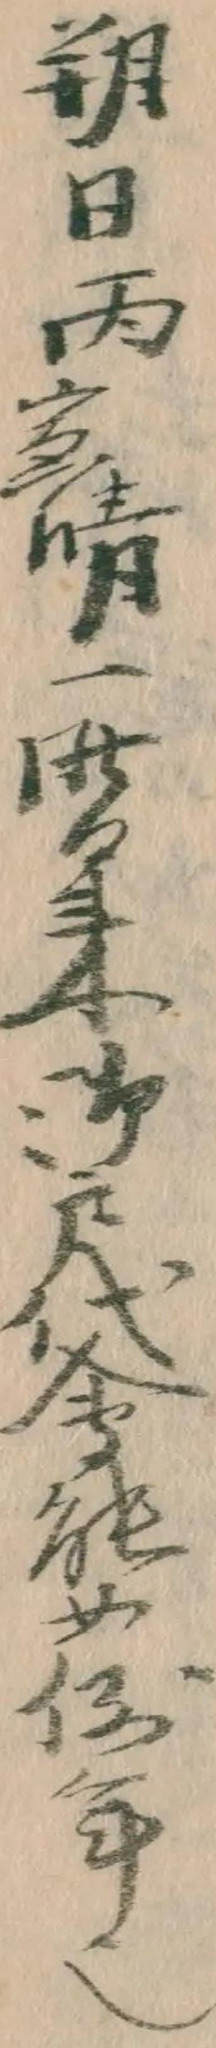朔日丙寅晴一昨日来御戸代會能如例年也
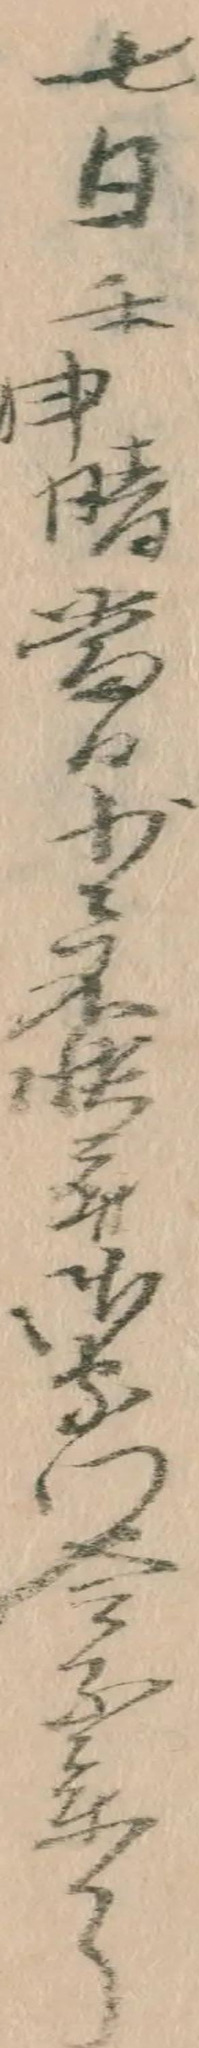七日壬申晴當日少々不快二付御家門令不参了
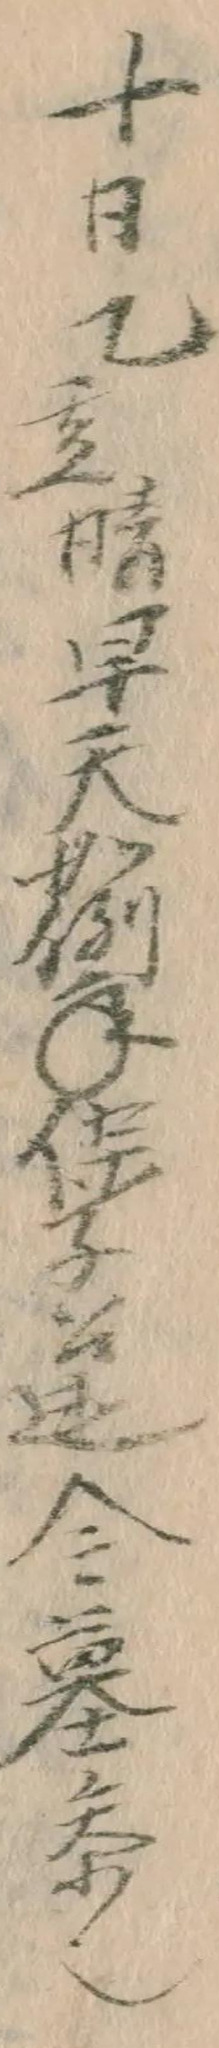十日乙亥晴早天如例年保子召連令墓参也
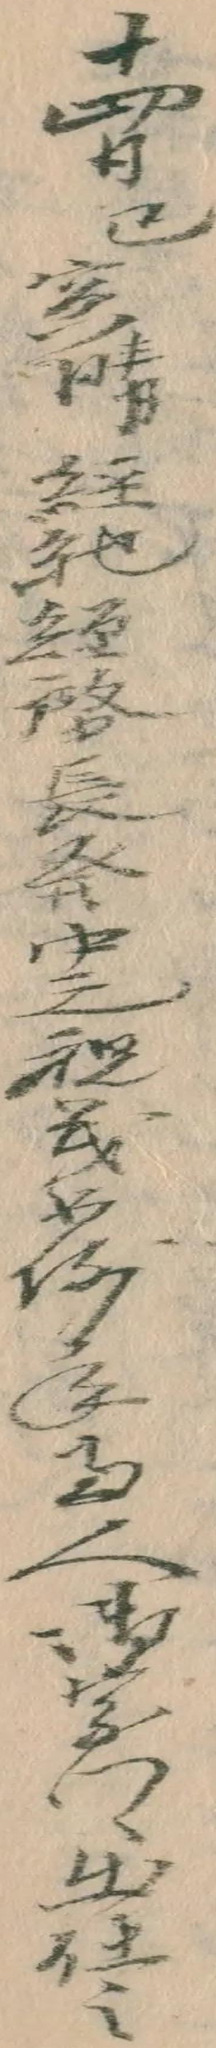十四日巳寅晴経紀経啓長発中元親義如例年両人御家門へ出仕之
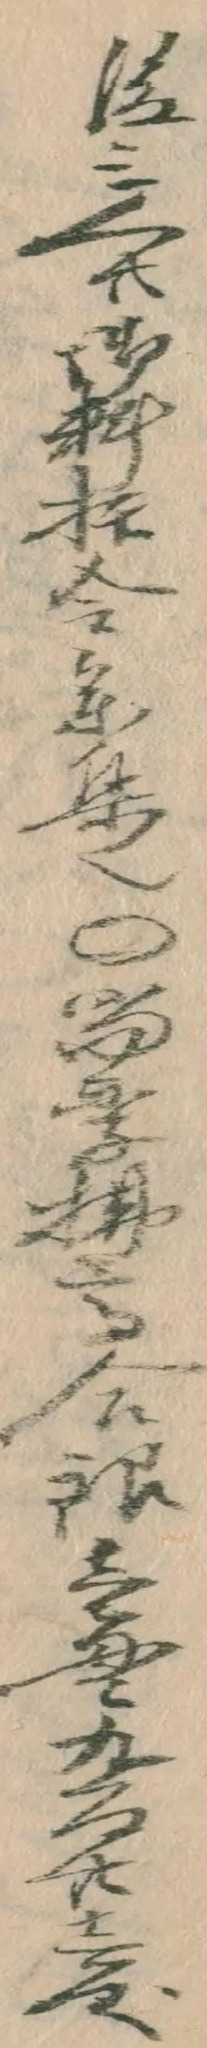後三人共御料拾令参集也〇當季払高合銀壱貫九百廿壱匁
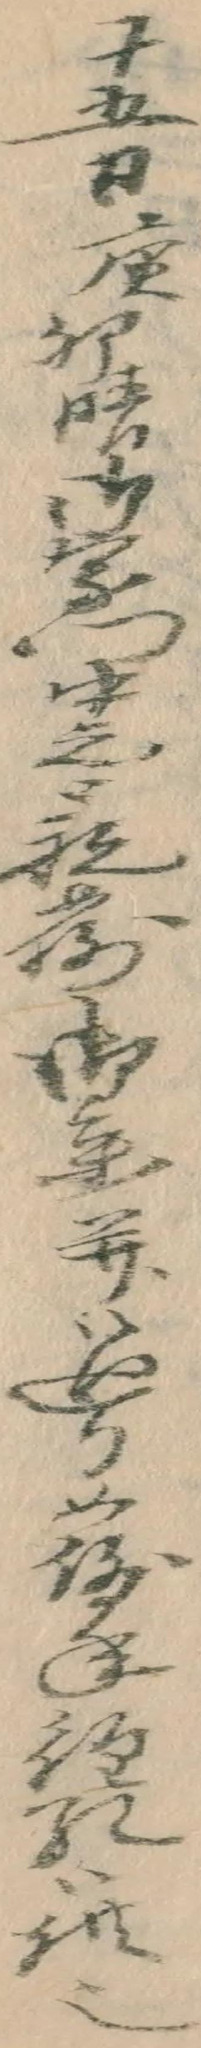十五日庚卯晴御家門中元御祝御参并御廻り如例年経紀御供也
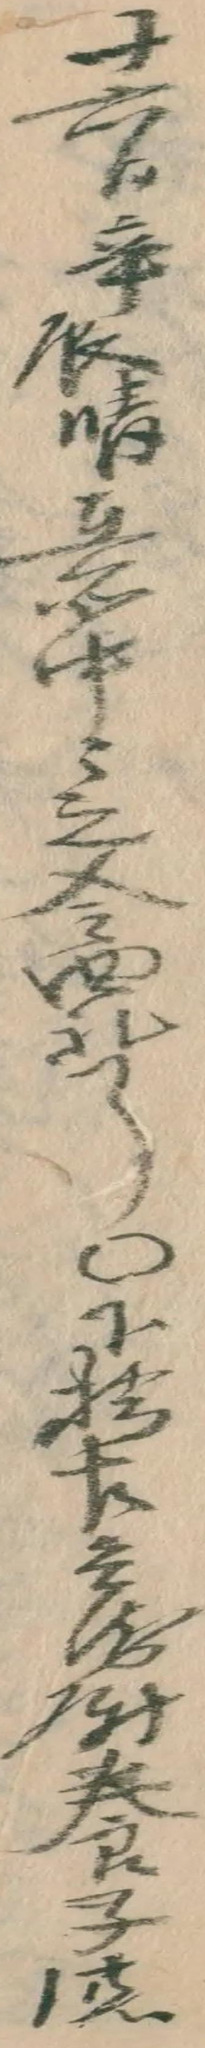十六日辛辰晴在所中々元令回札了〇下橋左兵衛尉養子諸
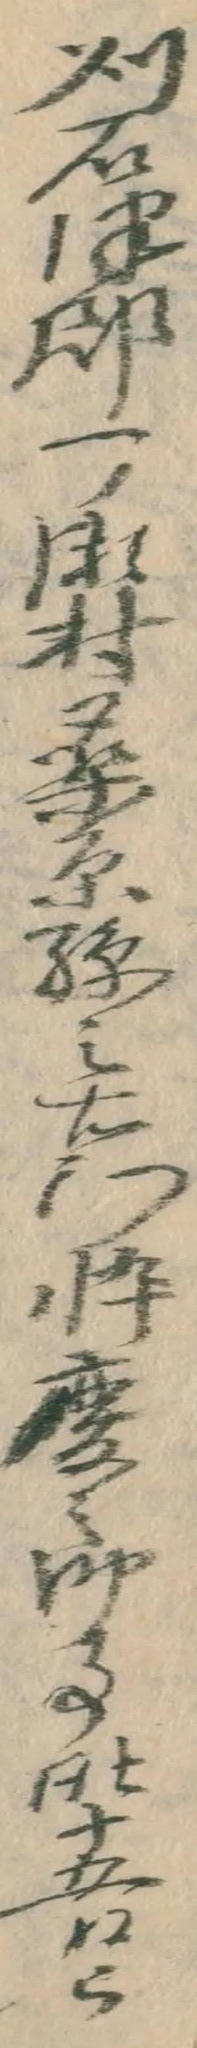刈石津郡一ノ瀬村桑原孫之右衛門忰慶之助事昨十五日被
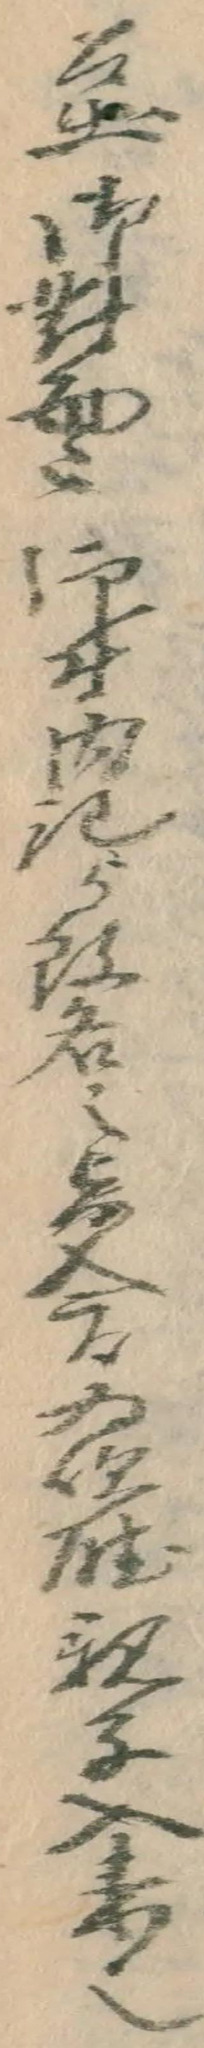召出御對面被仰付内記与改名之旨今日為吹聴親子入来也

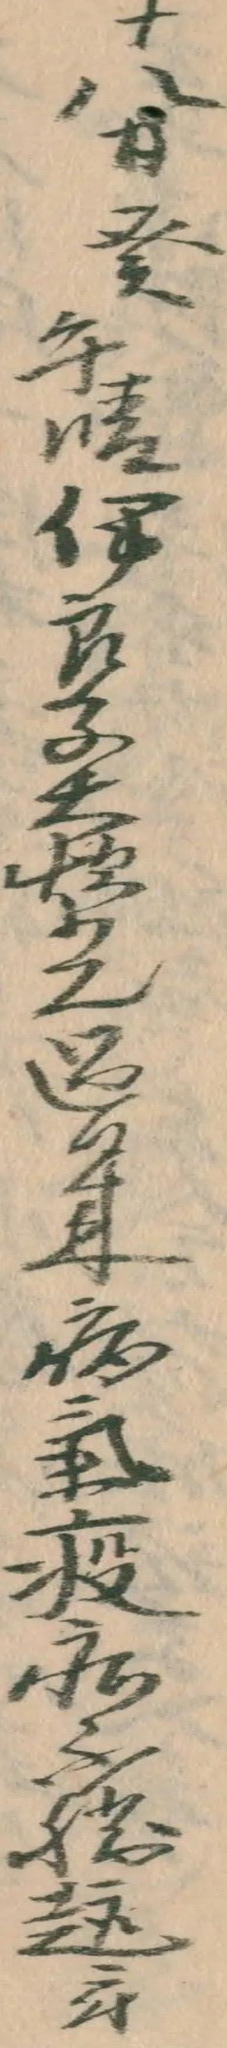十八日癸午晴伊良子大炊允過日来病氣疫病不勝趣ニ付
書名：賀茂社記録. 第69冊
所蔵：国立国会図書館 National Diet Library, JAPAN
